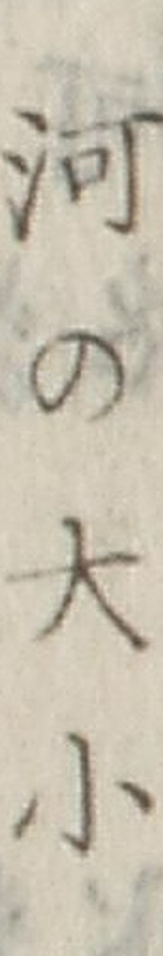河の大小
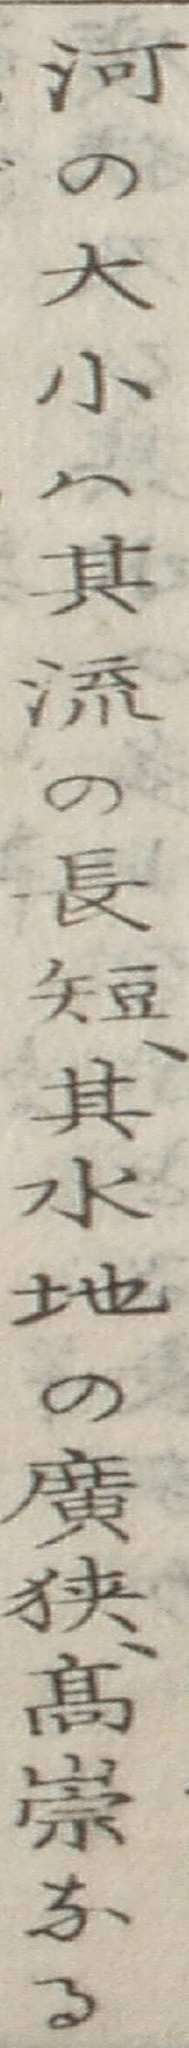河の大小は其流の長短、其水地の広狭、高崇なる
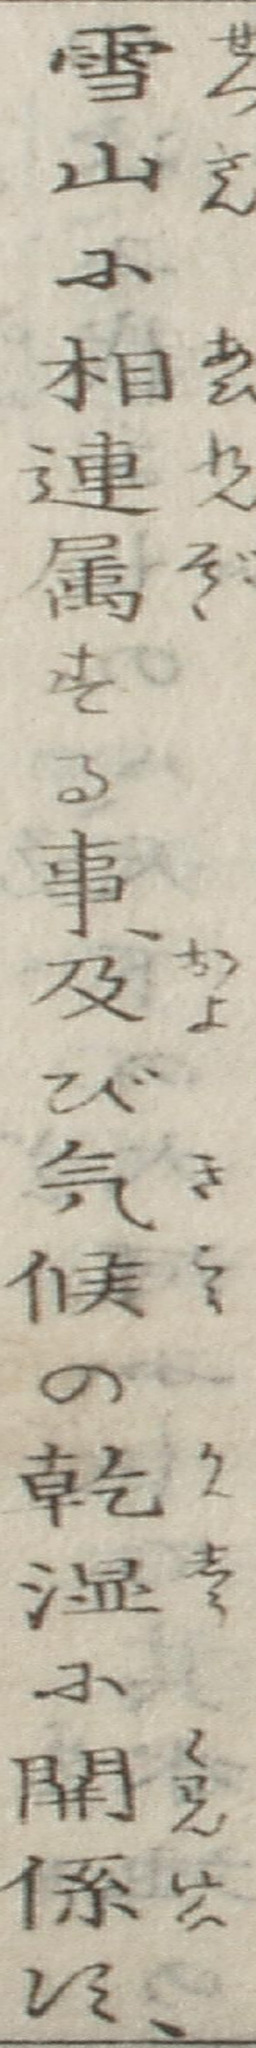雪山に相連属する事、及び気候の乾湿に関係す、
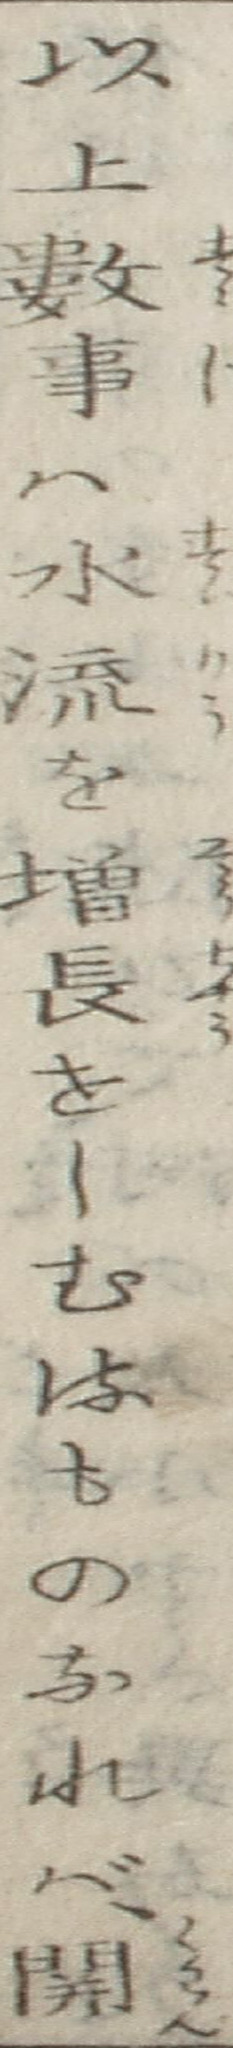以上数事は水流を増長せしむるものなれば、関

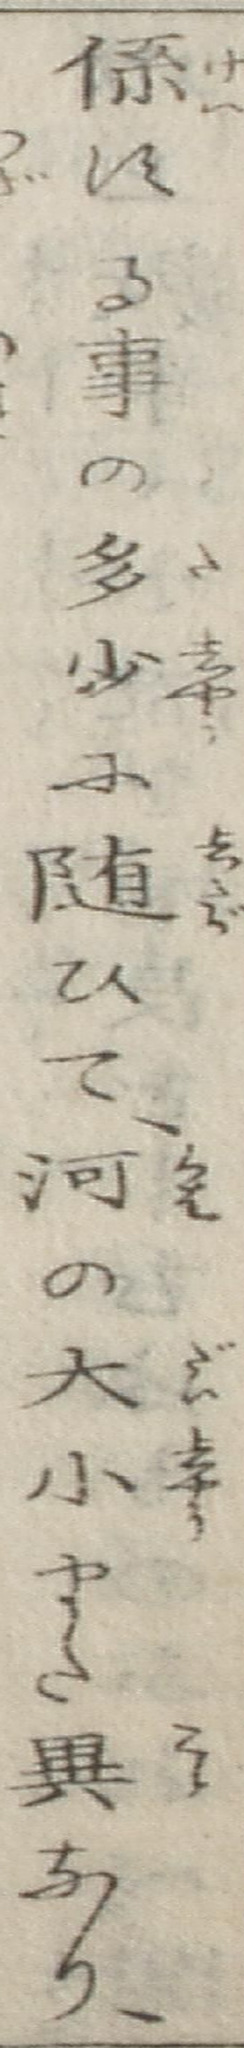係する事の多少に随ひて、河の大小また異なり、
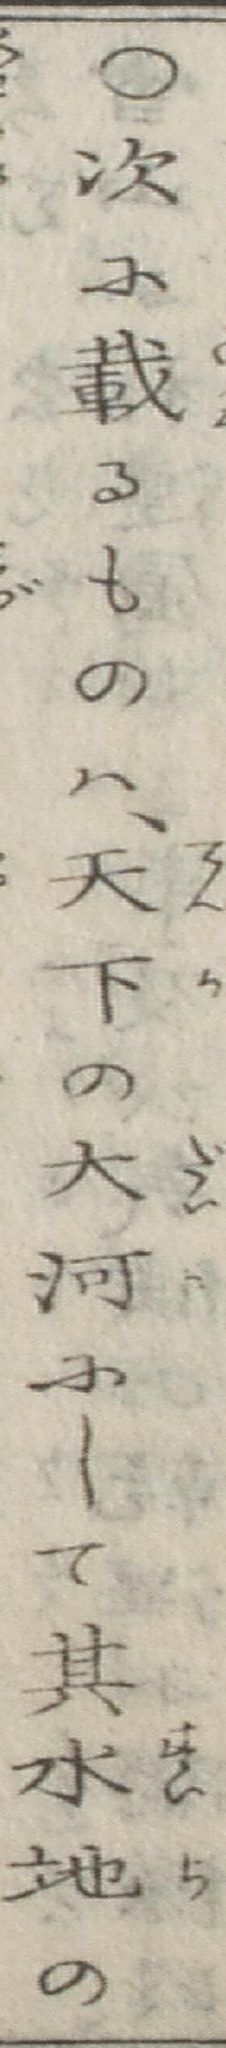〇次に載るものは、天下の大河にして其水地の
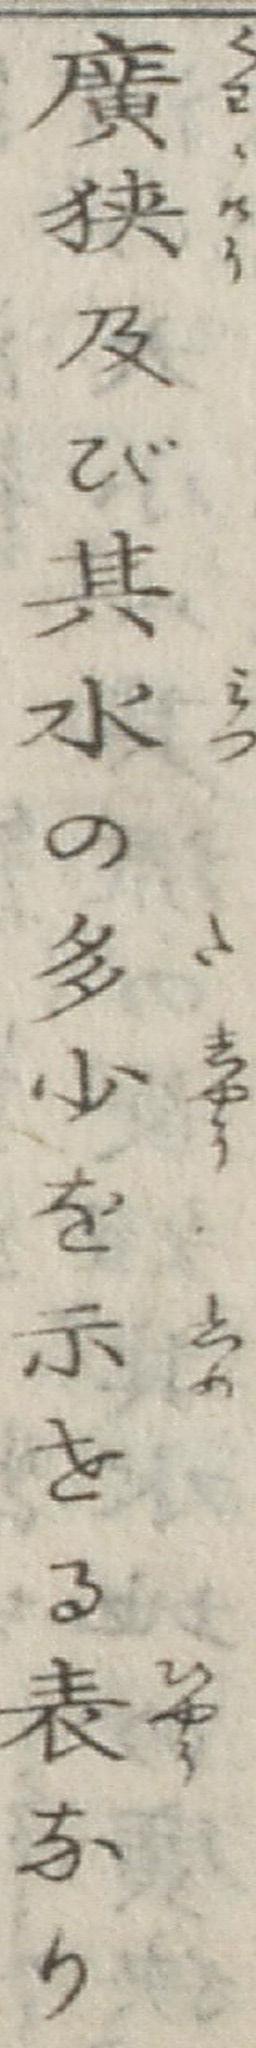広狭及び其水の多少を示せる表なり
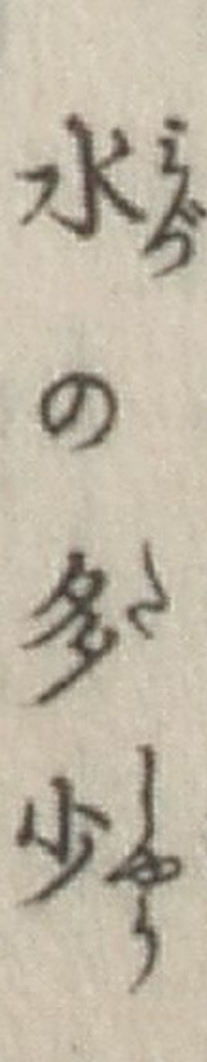水の多少
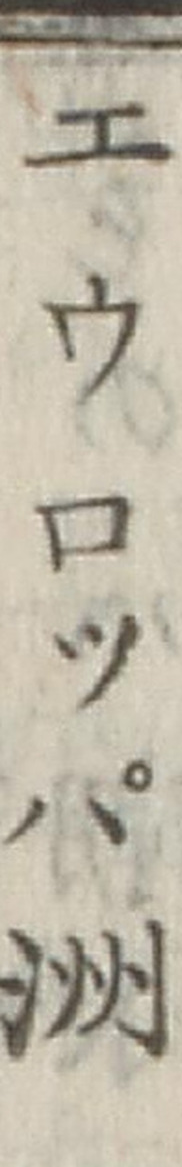エウロッパ洲
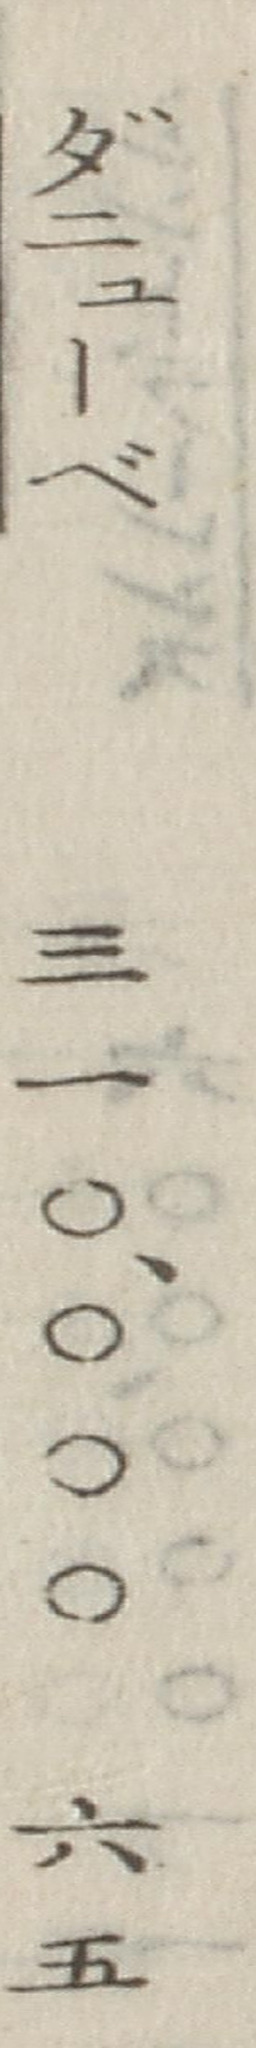ダニューベ三一〇、〇〇〇六五
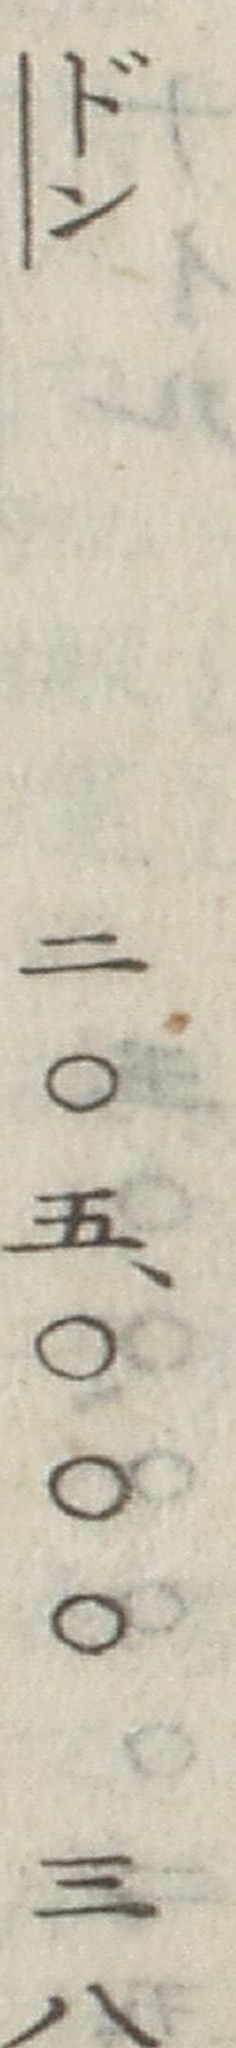ドン二〇五、〇〇〇三八
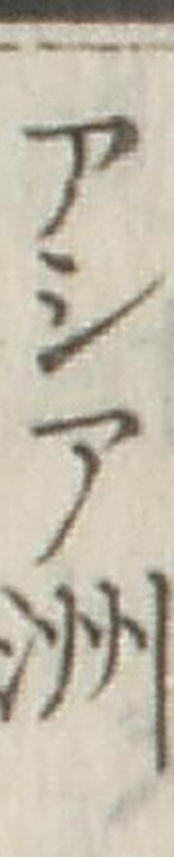アシア洲
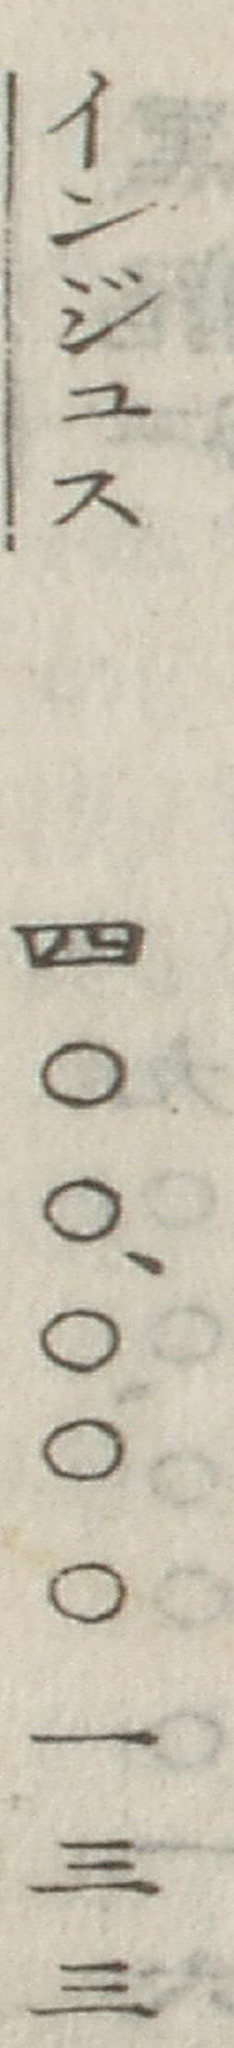インジュス四〇〇、〇〇〇一三三
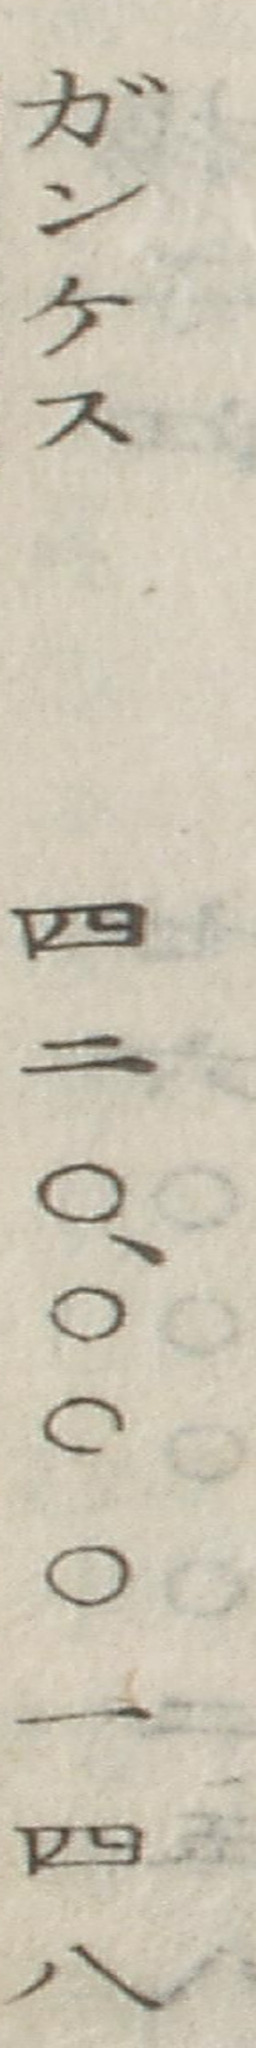ガンケス四二〇、〇〇〇一四八

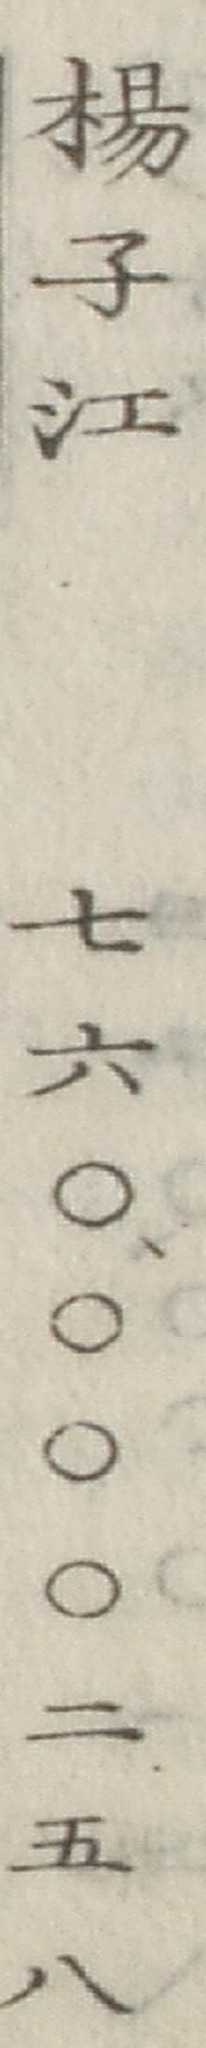揚子江七六〇、〇〇〇二五八
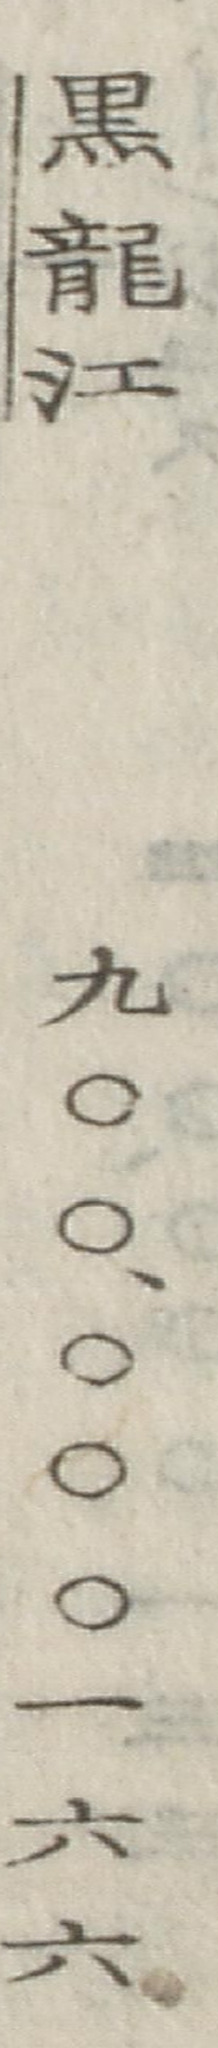黒龍江九〇〇、〇〇〇一六六
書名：訓蒙　天然地理學　中
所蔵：東京大学地震研究所図書室 Earthquake Research Institute Library, The University of Tokyo, JAPAN
